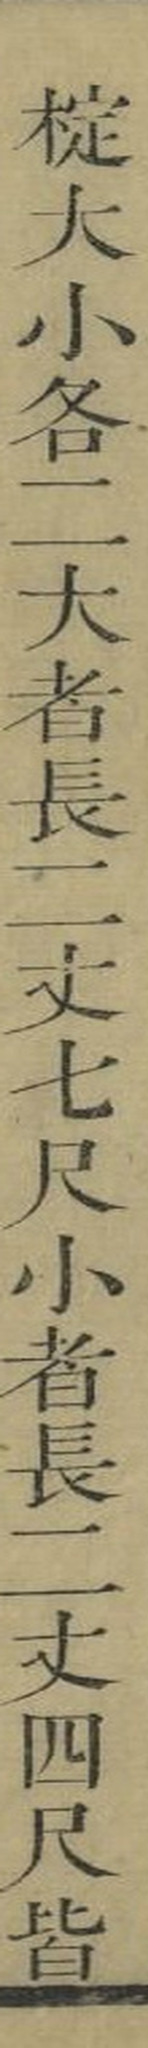椗大小各二大者長二丈七尺小者長二丈四尺皆
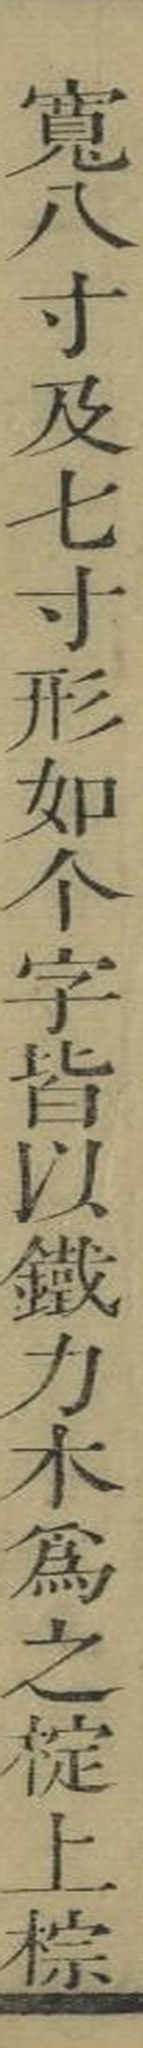寬八寸及七寸形如个字皆以鐵力木爲之椗上棕
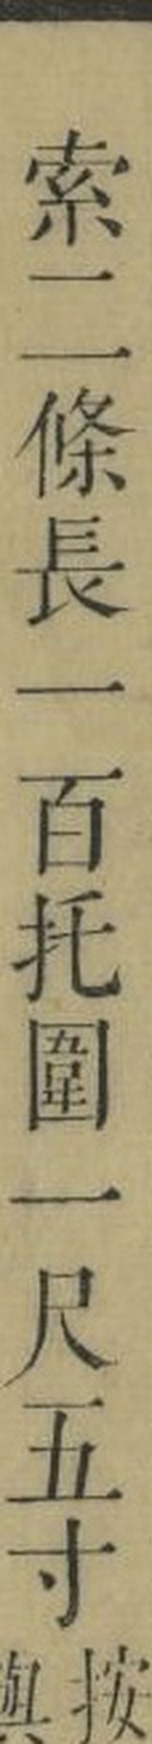繚母索二條長一十五托圍一尺五寸
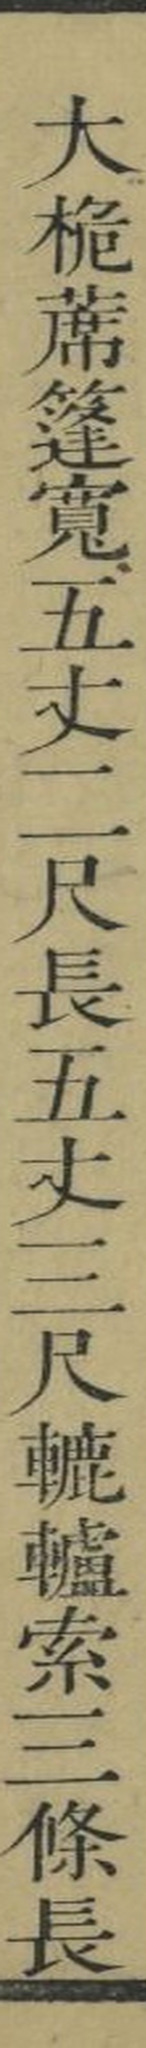大桅蓆篷寬五丈二尺長五丈三尺轆轤索三條長
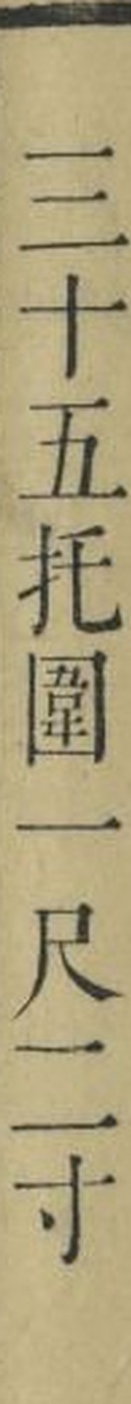三十五托圍一尺二寸
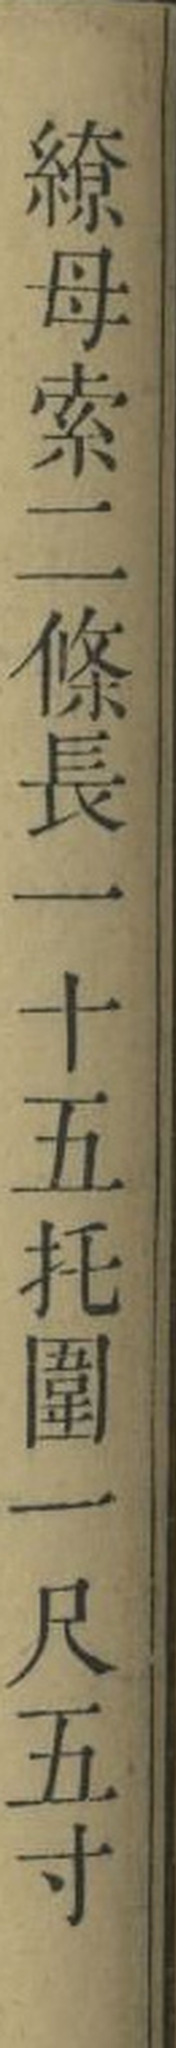繚母索二條長一十五托圍一尺五寸
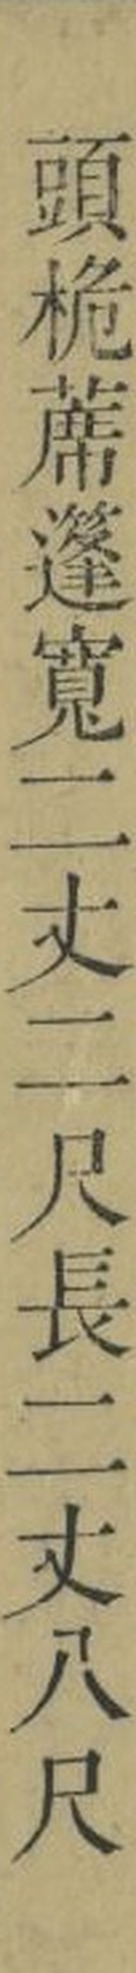頭桅蓆篷寬二丈二尺長二丈八尺
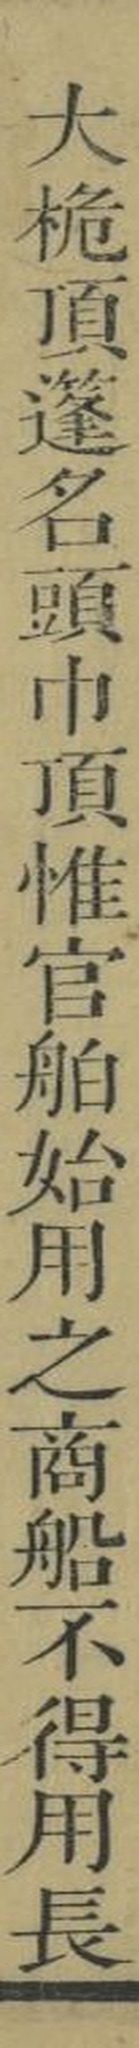大桅頂篷名頭巾頂惟官舶始用之商船不得用長
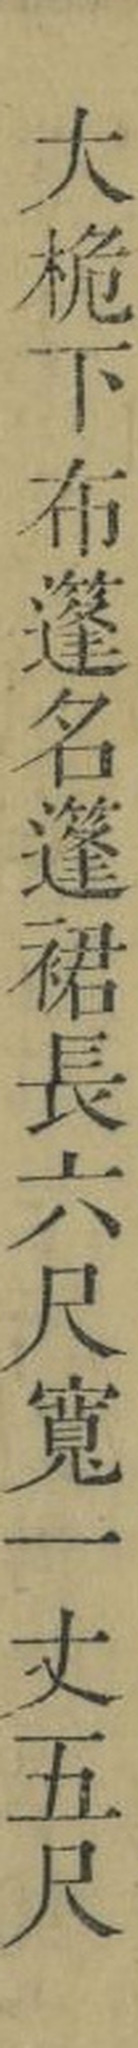大桅下布篷名篷裙長六尺寬一丈五尺
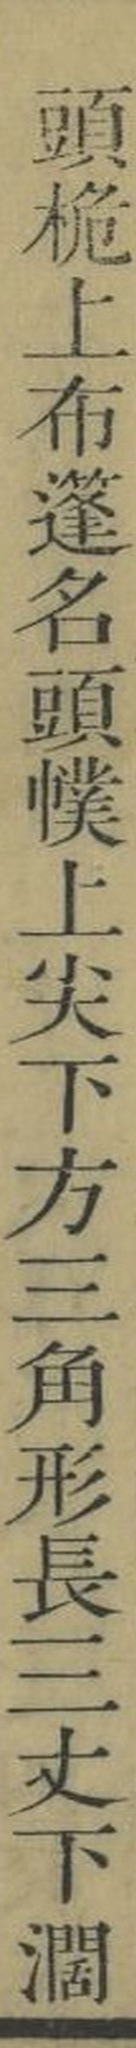頭桅上布篷名頭幞上尖下方三角形長三丈下濶
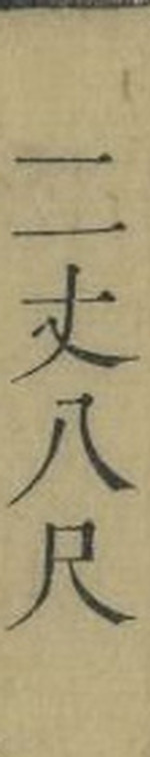二丈八尺
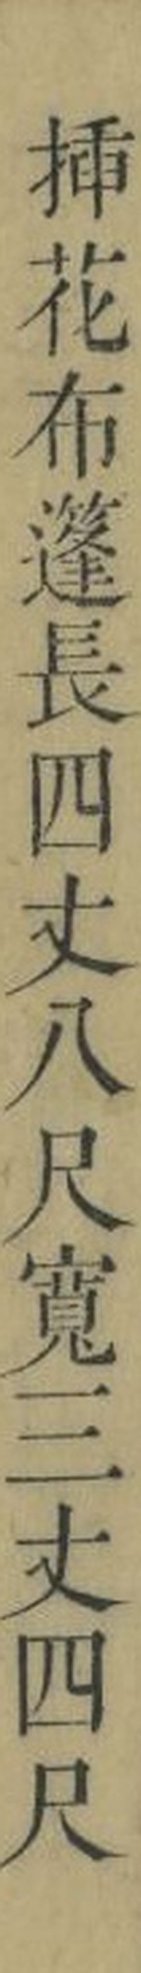揷花布篷長四丈八尺寬三丈四尺
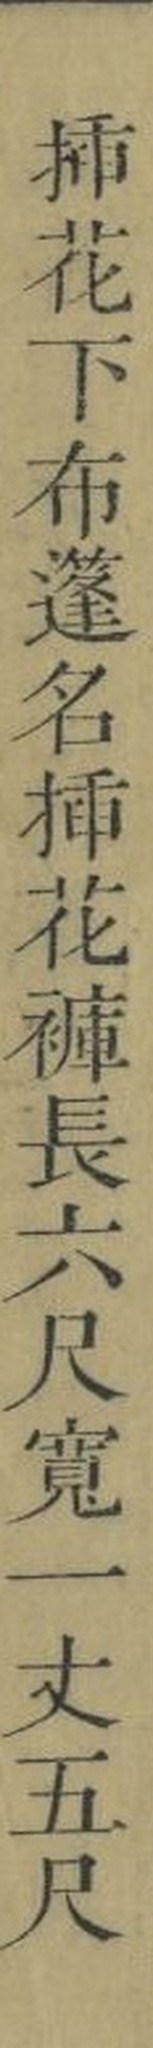揷花下布篷名揷花褲長六尺寬一丈五尺

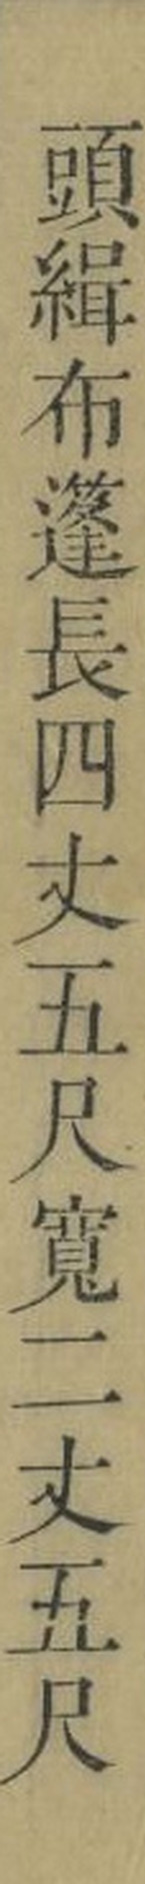頭緝布篷長四丈五尺寬二丈五尺
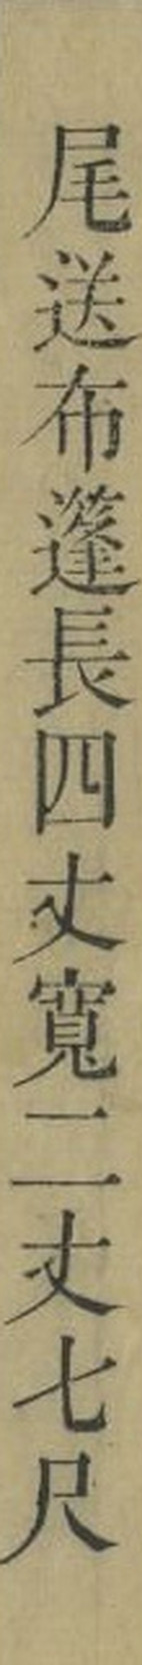尾送布篷長四丈寬二丈七尺
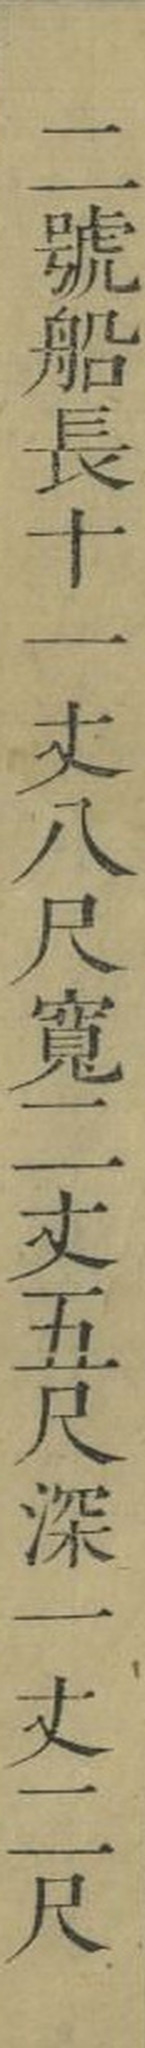二號船長十一丈八尺寬二丈五尺深一丈二尺
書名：中山伝信録 巻一
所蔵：University of the Ryukyus Library
